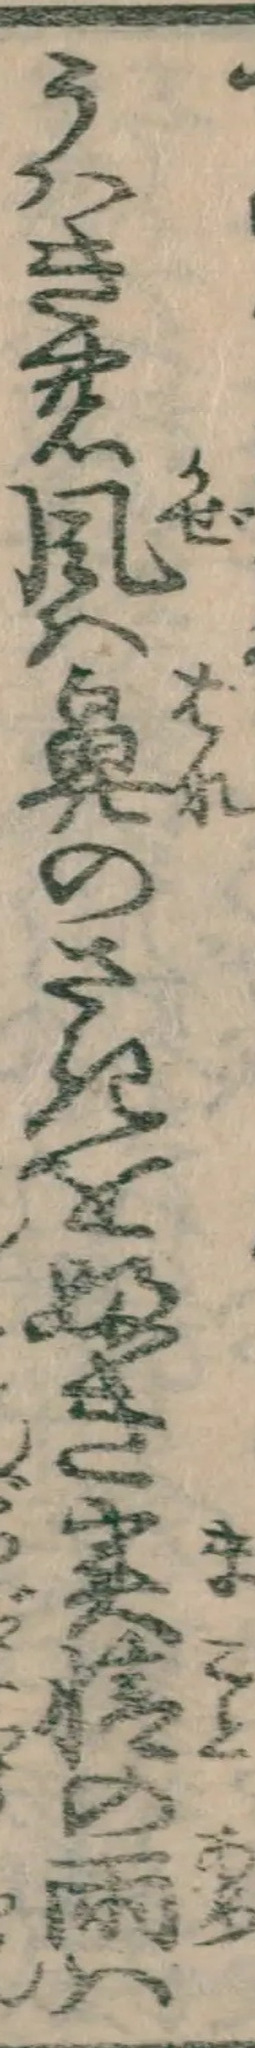うはきの風は鼻のさきをふき実情の雨は
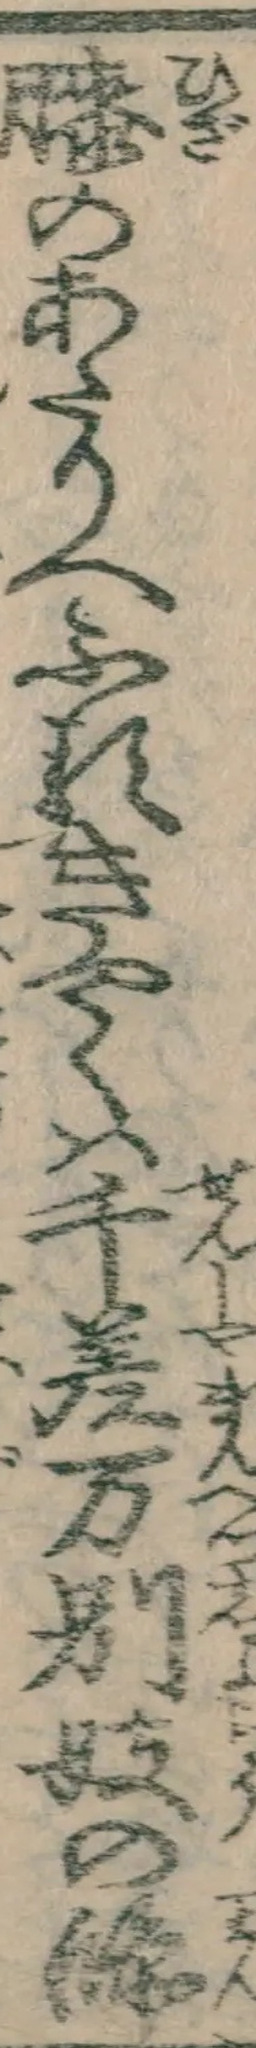膝のあたりへふるきやくは千差万別妓の臨
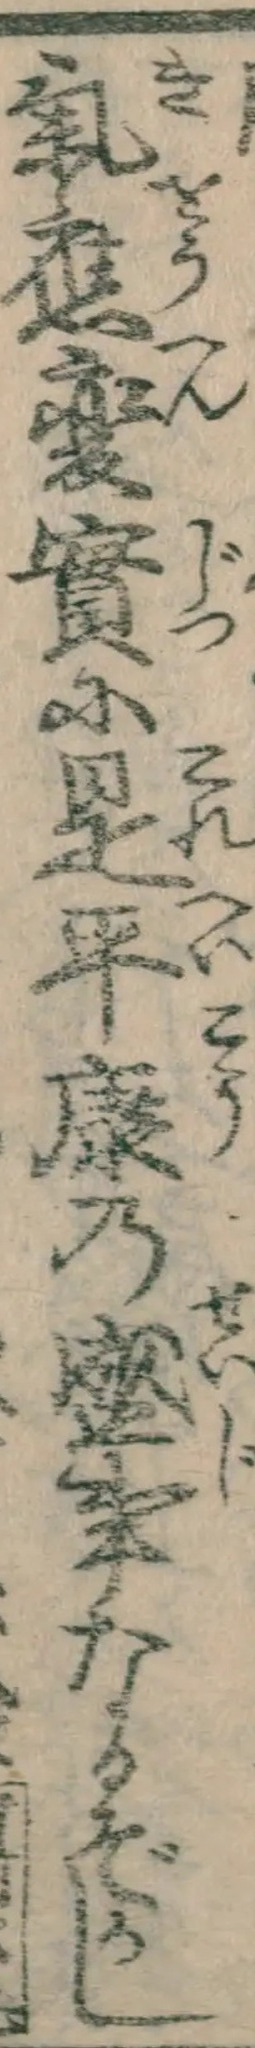気応変実に是平康の盛事なるぞかし

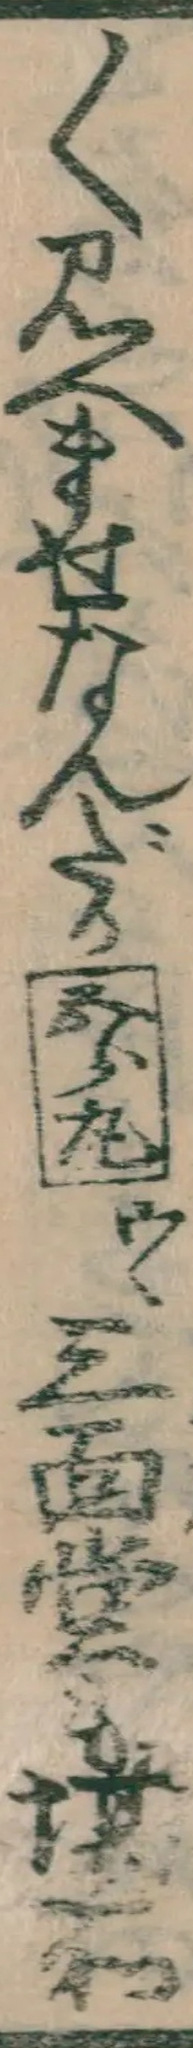〳〵見へませなんだか〈五郎丸〉ウヽ三面堂も場所
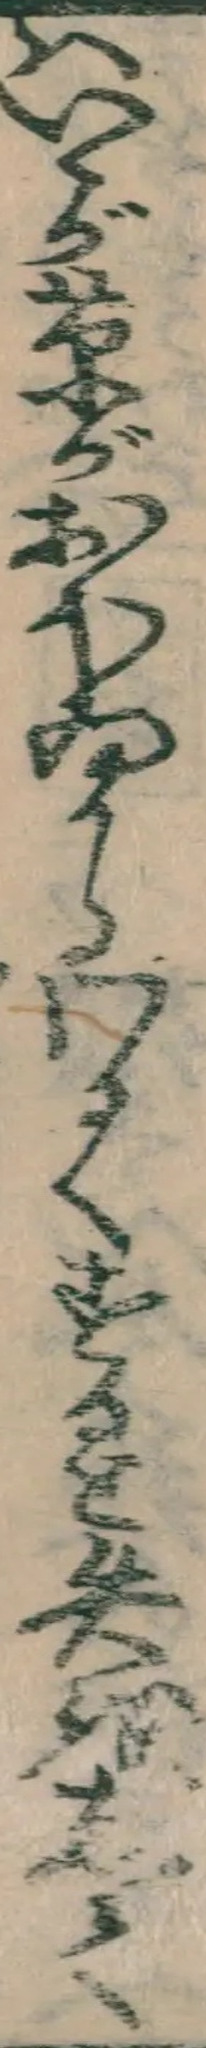はいゝが草がおほゐからわるくすると矢をして
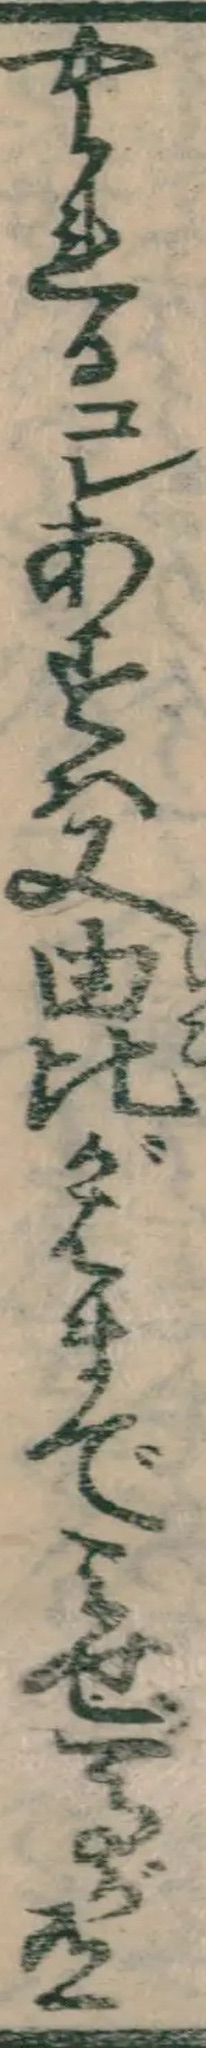やられるコレあすは又由比がはまでみせ馬が有
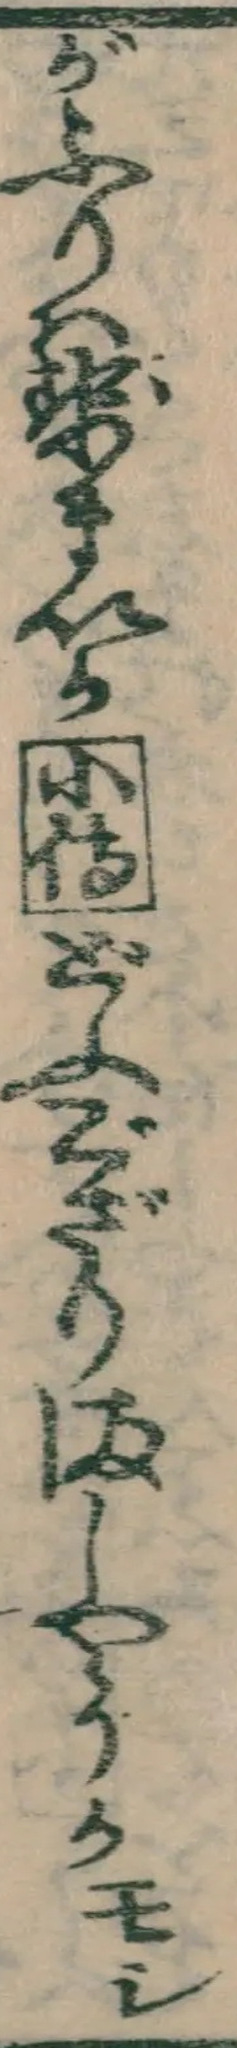がふりはせまいか〈小僧〉どふござりましやうかモシ
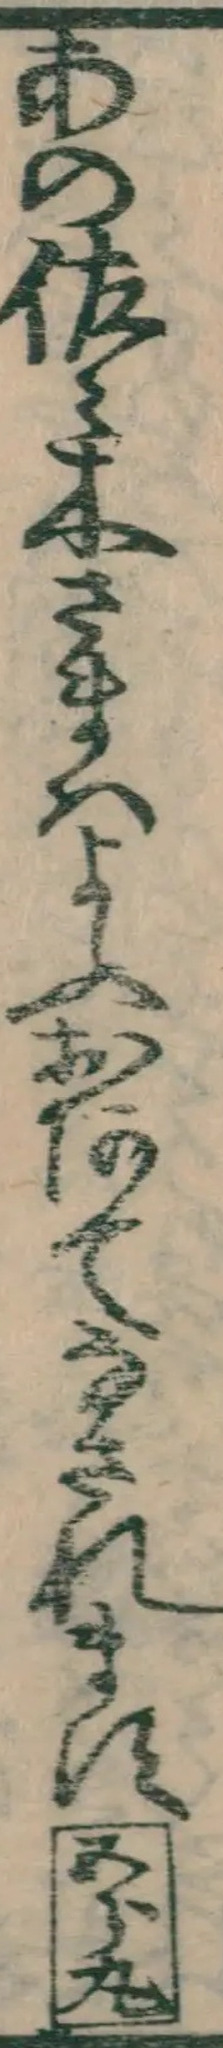あの佐々木さまはよふおあてなされます〈五郎丸〉

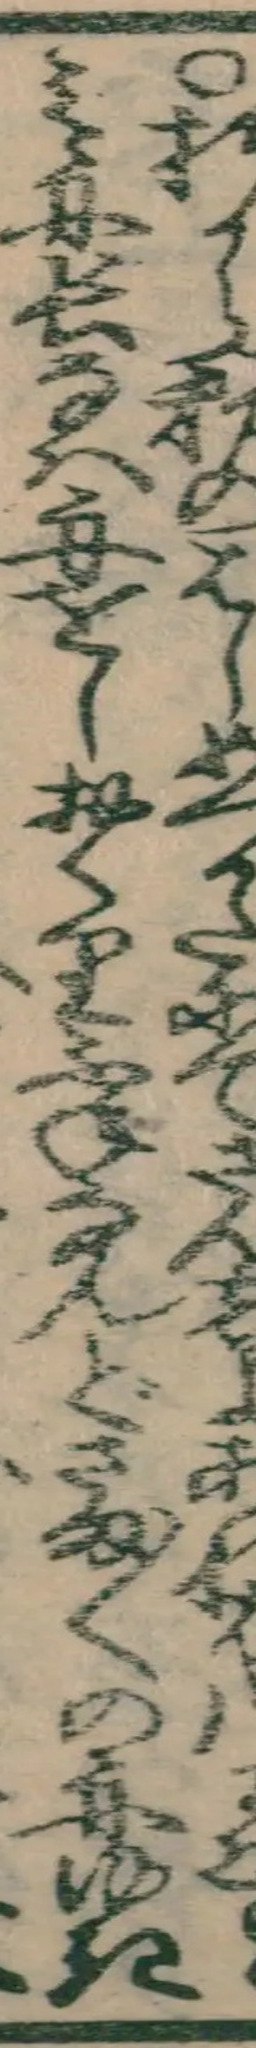み舟長なは舟をしおくりふねなんどさま〳〵の舟ゆき
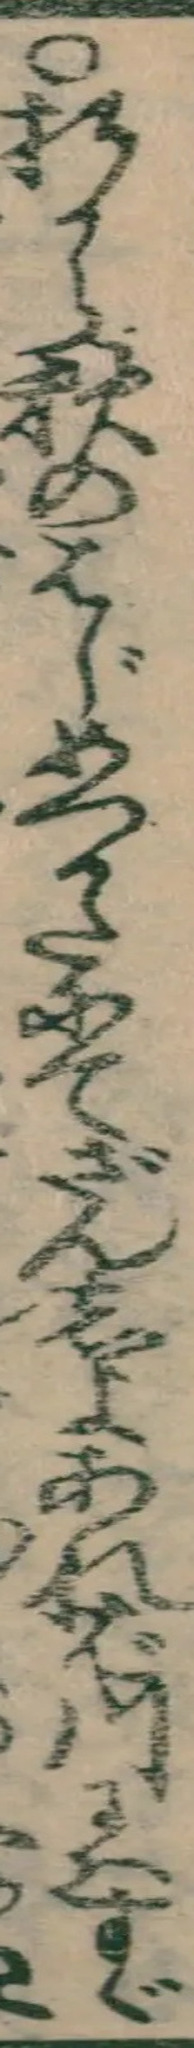○折から秋のはじめつかたにてざんしよあれば川にはすゞ
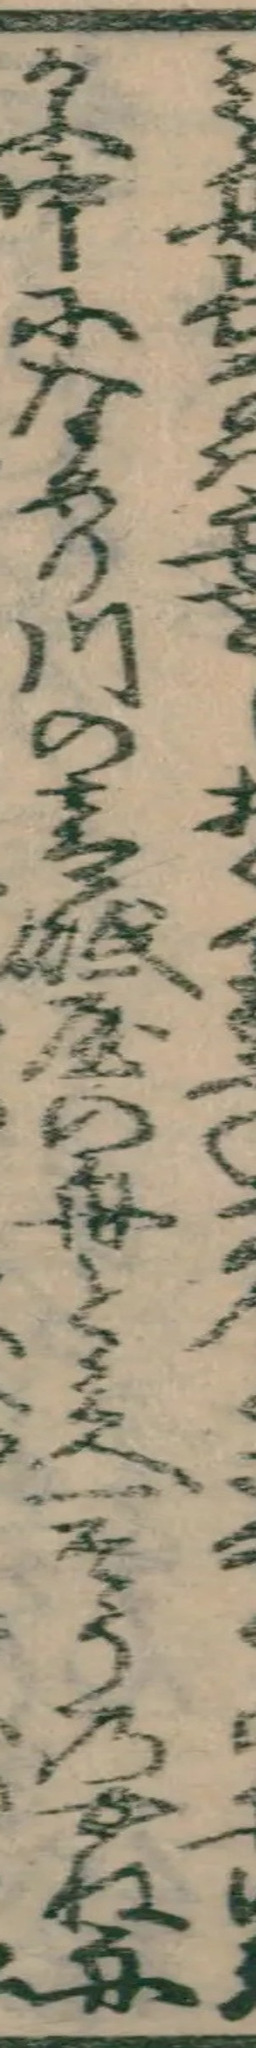かふ中になめり川の青砥屋の舟とみへ一そうのやね舟
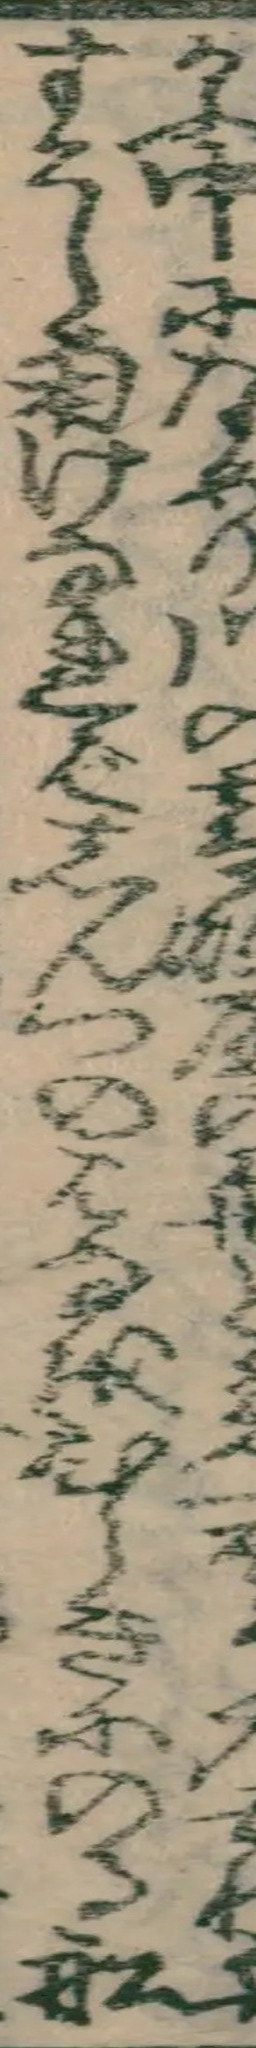すこし南？けなればしんつのはなをひらきにのる船
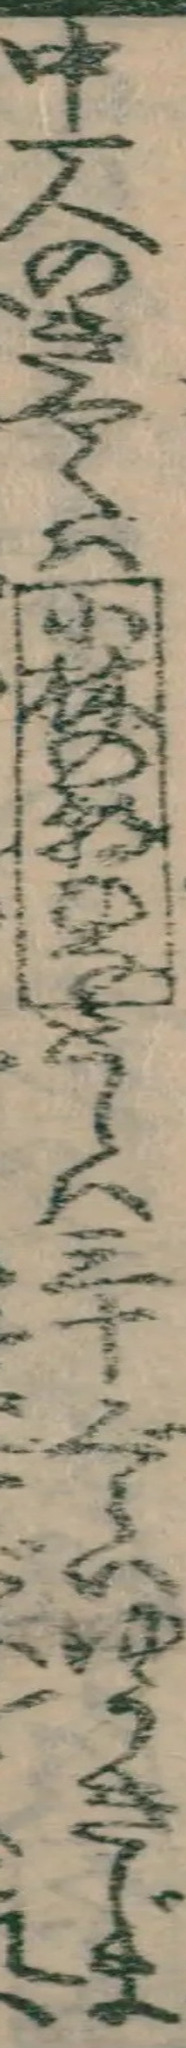中一人のきやくは〈小林の朝ひな〉としは三十ぐらいゆうきじま
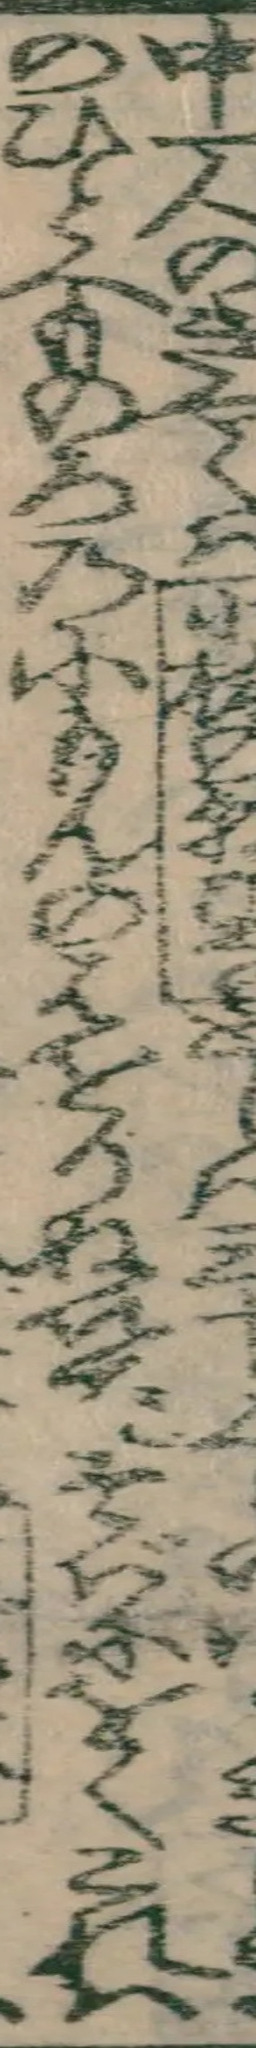のひとへものろの小もんのはをりぬいでそばにをくこれは
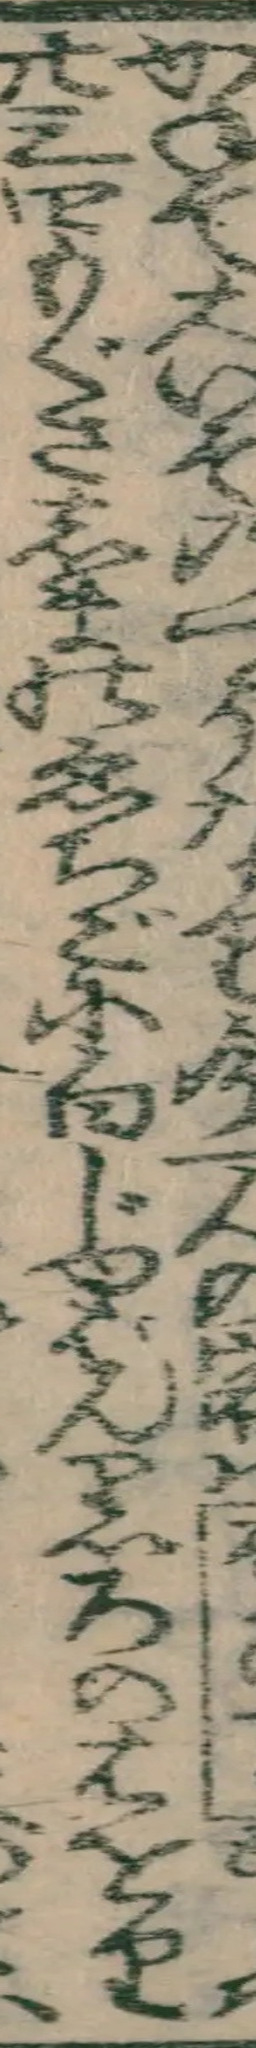廿三四もぐさしまのゑちごに白じゆばん黒ろのはをり
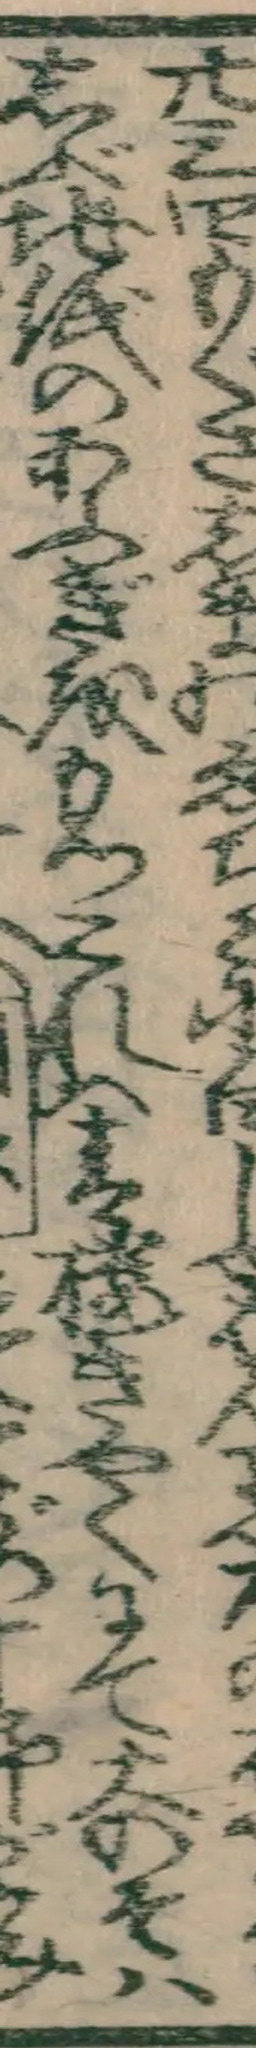しぶ地紙のあふぎをもつこれは青楼きやくにて大のそは
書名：教訓読本：大礒風俗仕懸文庫
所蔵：国立国会図書館 National Diet Library, JAPAN
